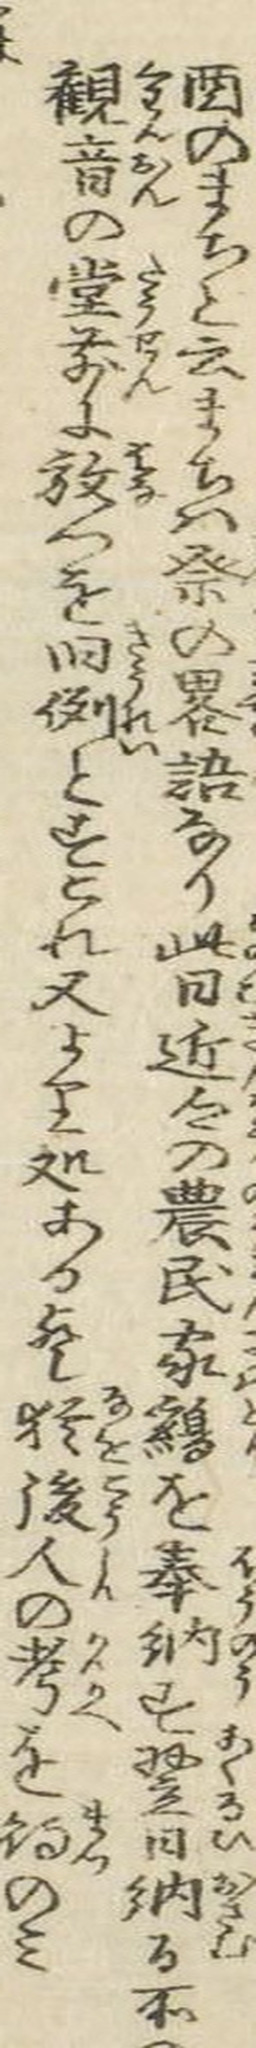観音の堂前に放つを旧例とすこれ又より処ある歟猶後人の考を待のみ
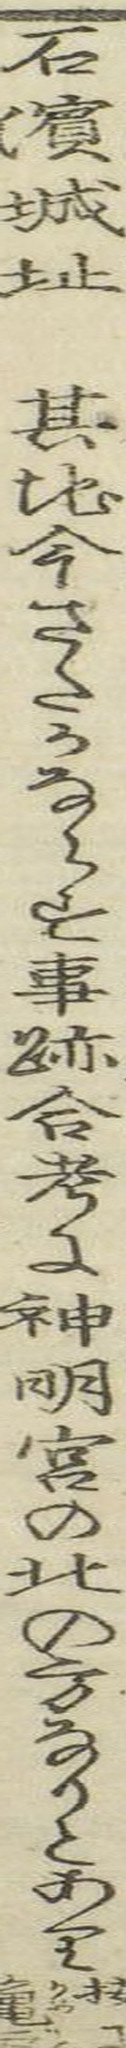石浜城址其地今さたかならす事跡合考に神明宮の北の方なりとあり按に亀戸

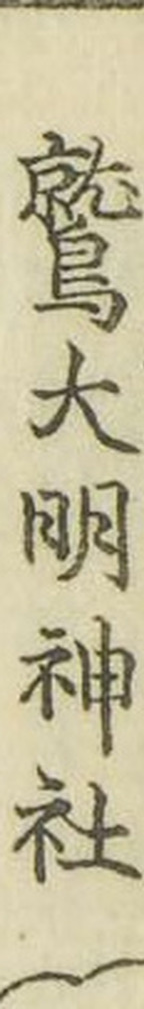鷲大明神社
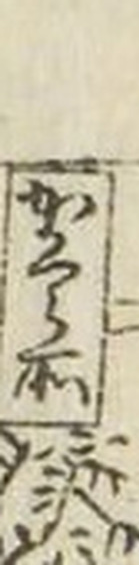かくら所

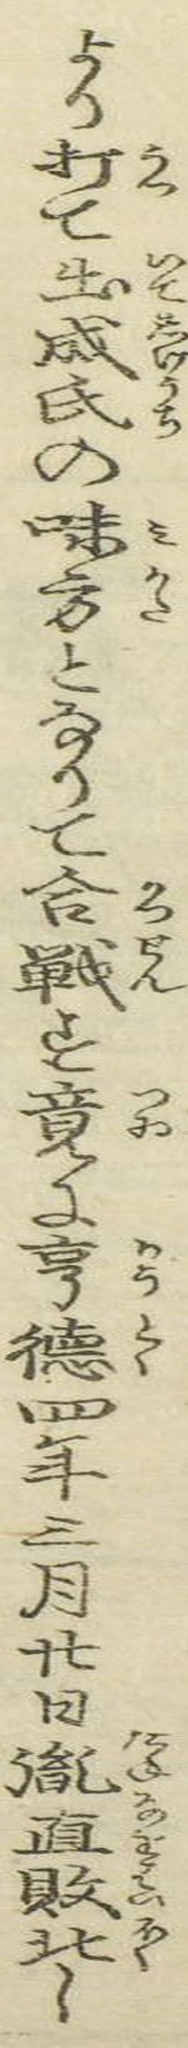より打て出成氏の味方となりて合戦す竟に享徳四年三月廿日胤直敗北し
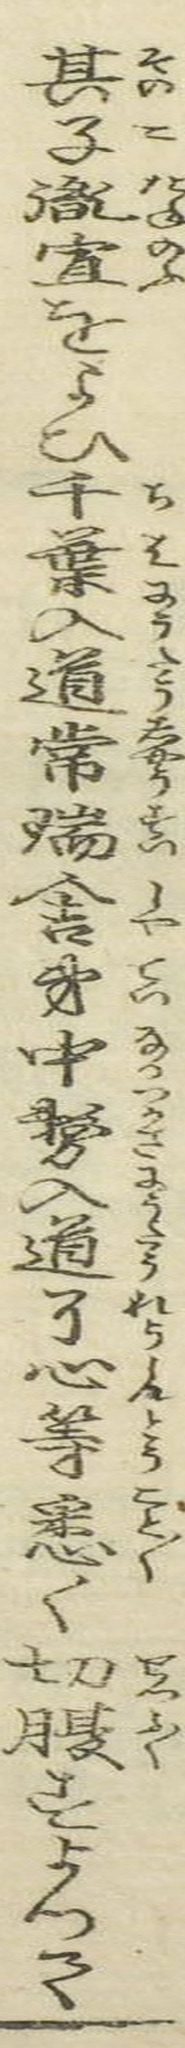其子胤宣をよひ千葉入道常瑞舎弟中務入道了心等悉く切腹すよつて
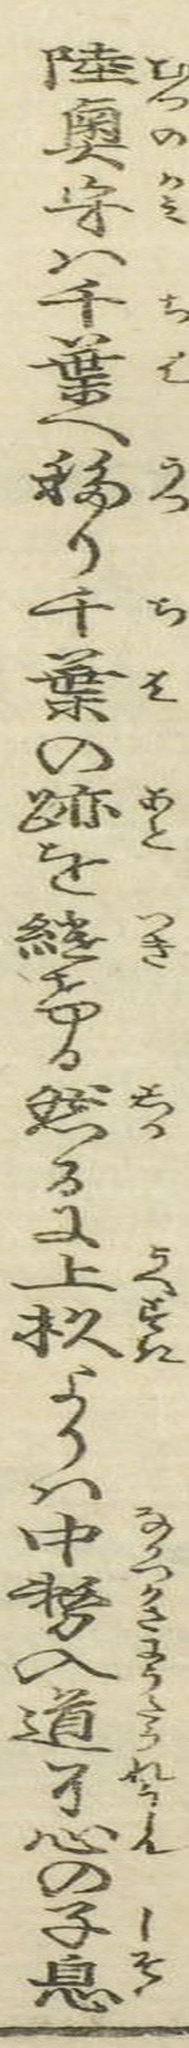陸奥守は千葉へ移り千葉の跡を継ける然るに上杉よりは中務入道了心の子息
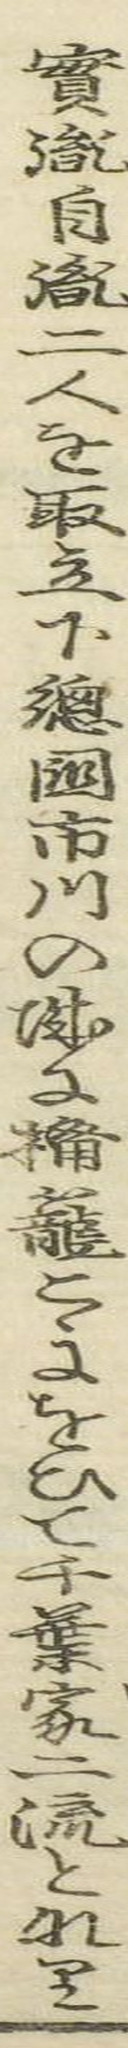実胤自胤二人を取立下総国市川の城に楯籠こゝにをひて千葉家二流となり
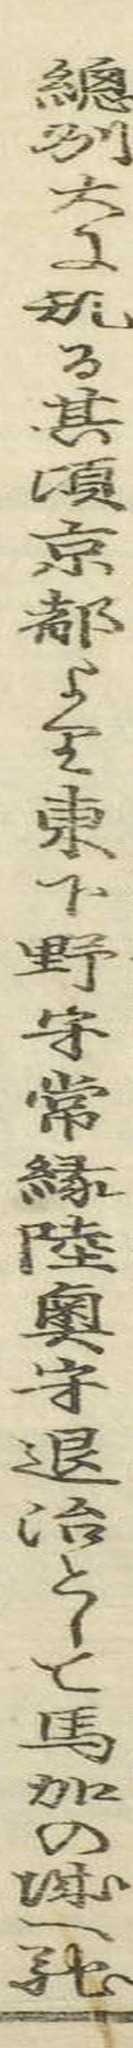総州大に乱る其頃京都より東下野守常縁陸奥守退治として馬加の城へ馳
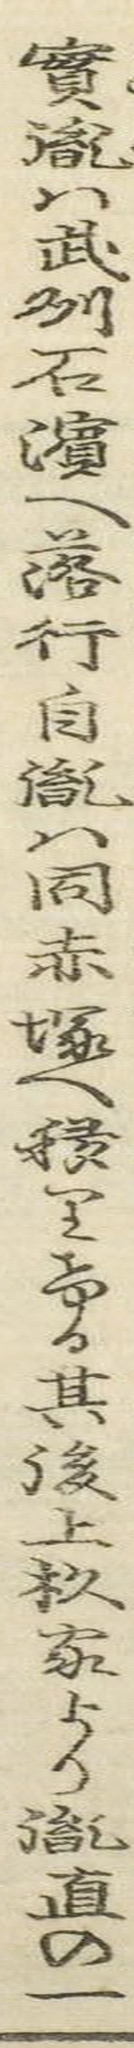実胤は武州石浜へ落行自胤は同赤塚へ移りける其後上杉家より胤直の一
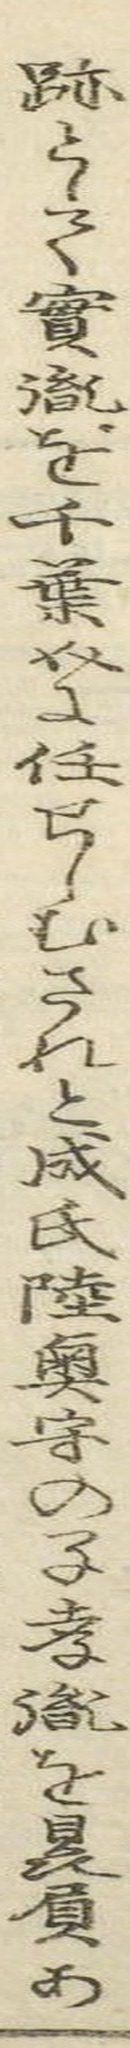跡として実胤を千葉介に任せしむされと成氏陸奥守の子孝胤を贔屓あ
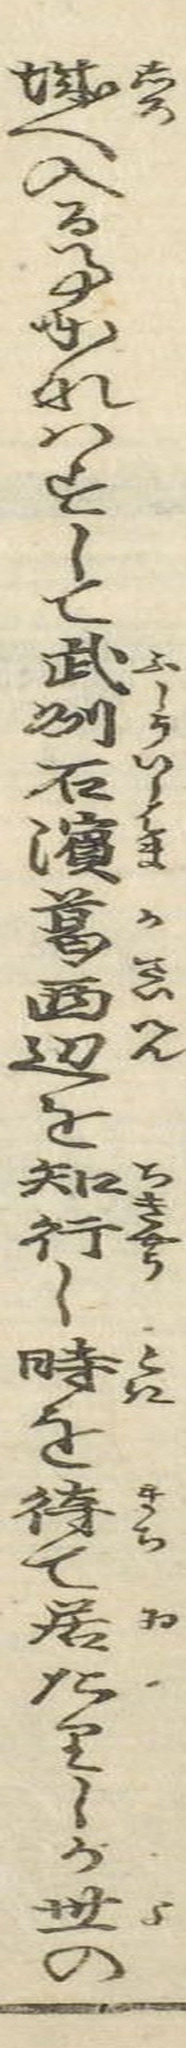城へ入る事かなはすして武州石浜葛西辺を知行し時を待て居たりしか世の
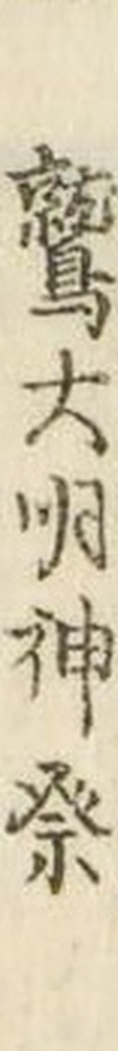鷲大明神祭
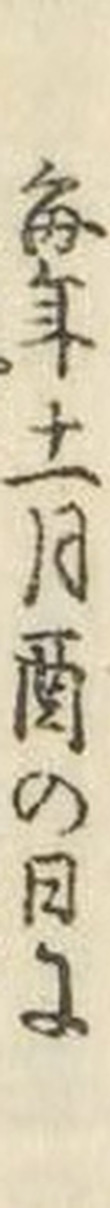毎年十一月酉の日に
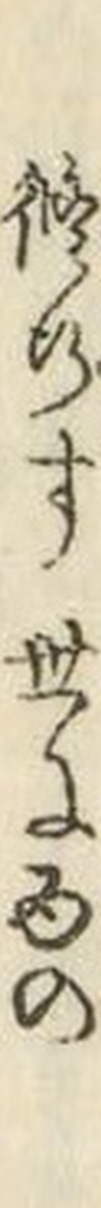修行す世に酉の
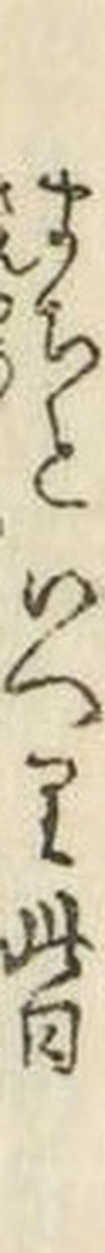まちといへり此日
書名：江戸名所図会 20巻 巻之17
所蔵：東京学芸大学教育コンテンツアーカイブ
